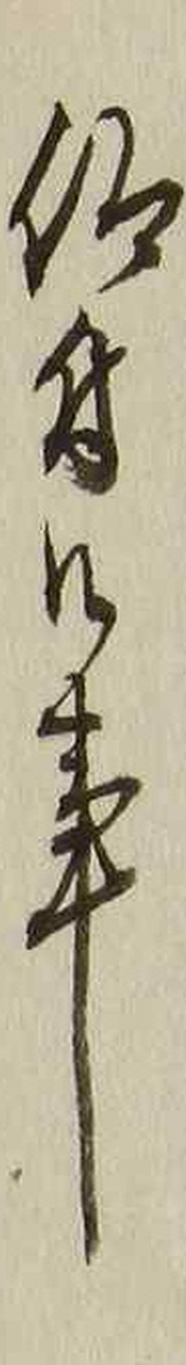仰付候事
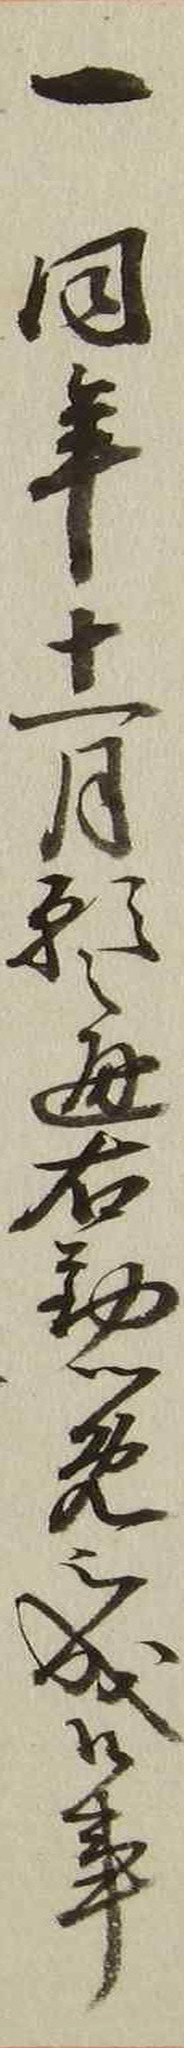一同年十一月願之通右勤御免被成候事
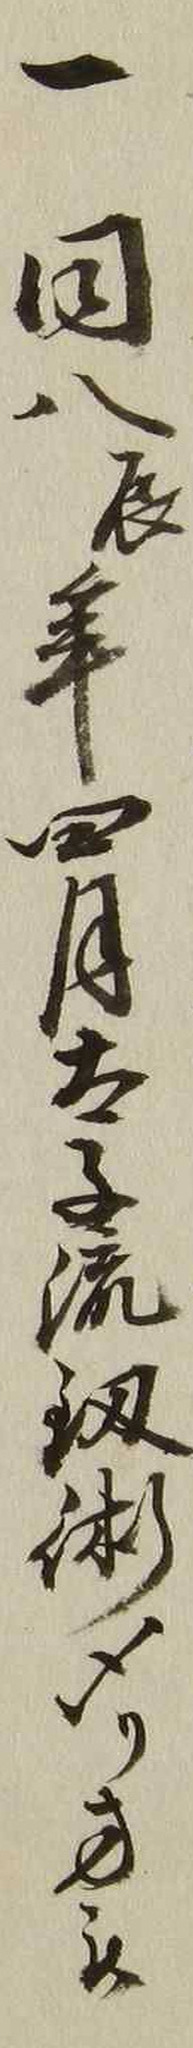一同八辰年四月太子流釼術〆り方被
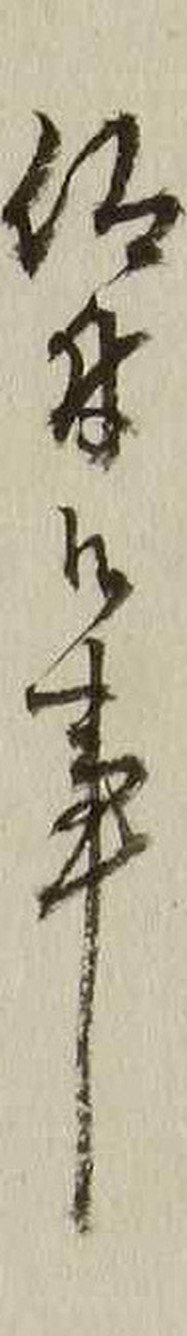仰付候事
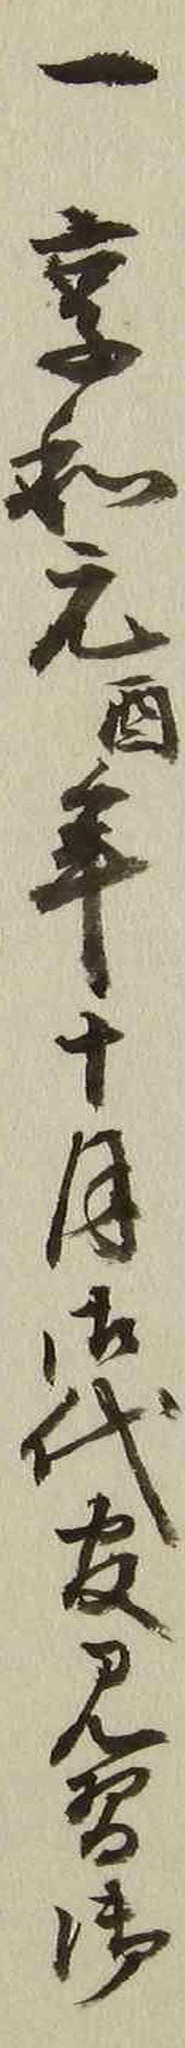一享和元酉年十月御代官見習御
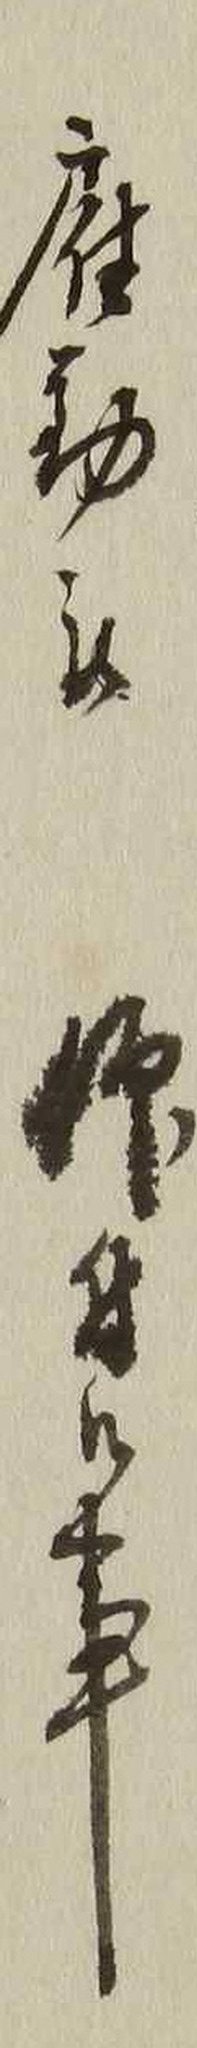雇勤被仰付候事
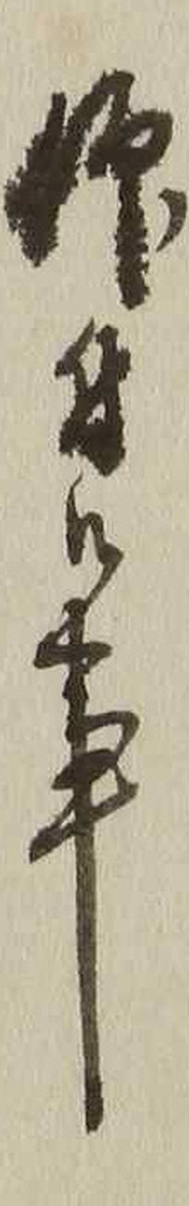仰付候事
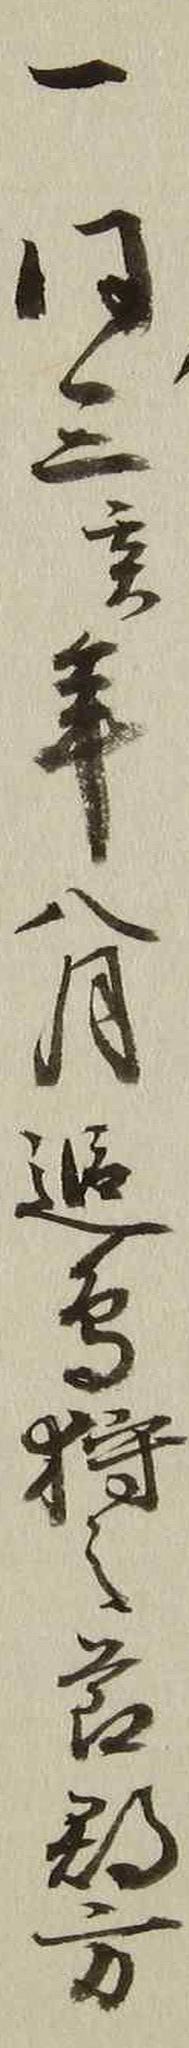一同三亥年八月追鳥狩之節郡方
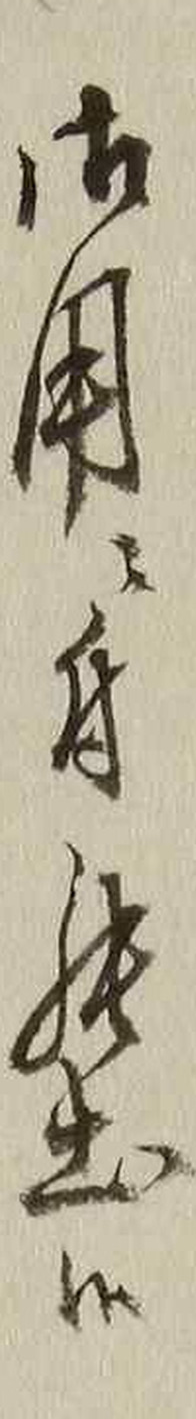御用ニ付罷出候
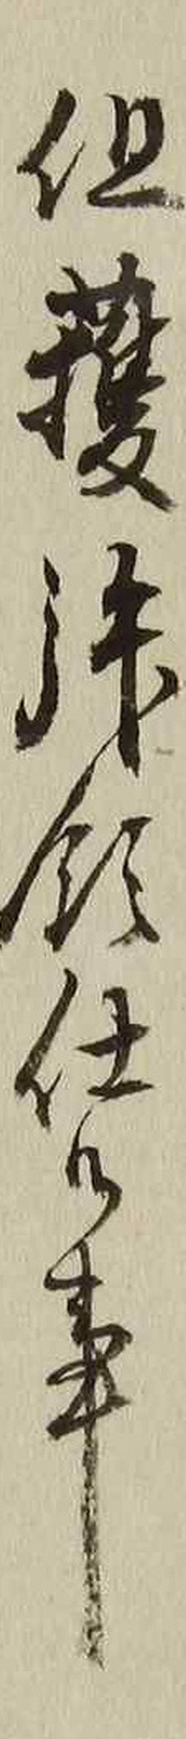但獲拝領仕候事
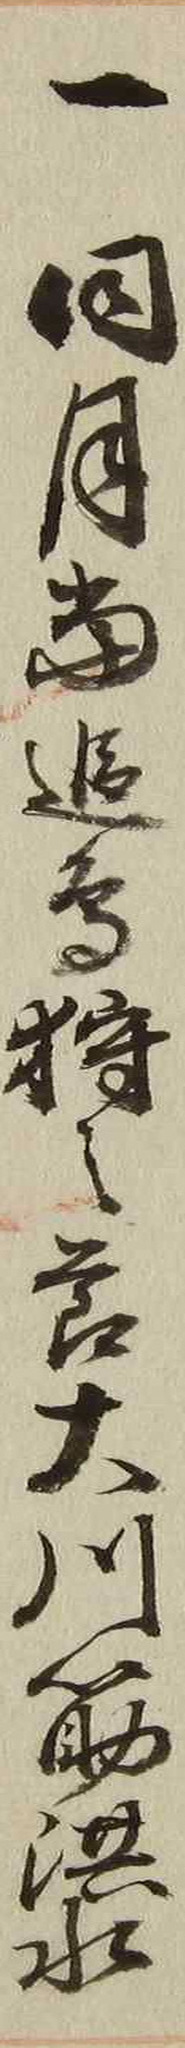一同月当追鳥狩之節大川筋洪水
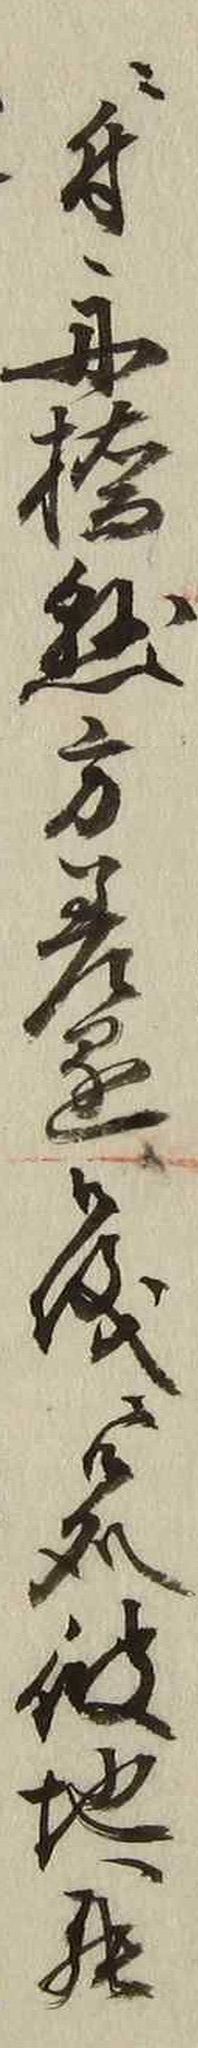ニ付舟橋懸方差懸候儀ニ候処彼地へ罷
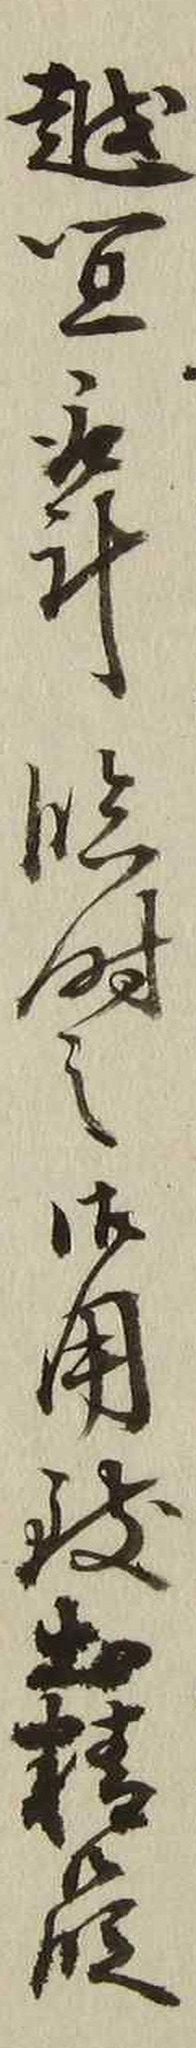越宜取計臨時之御用致出精候段
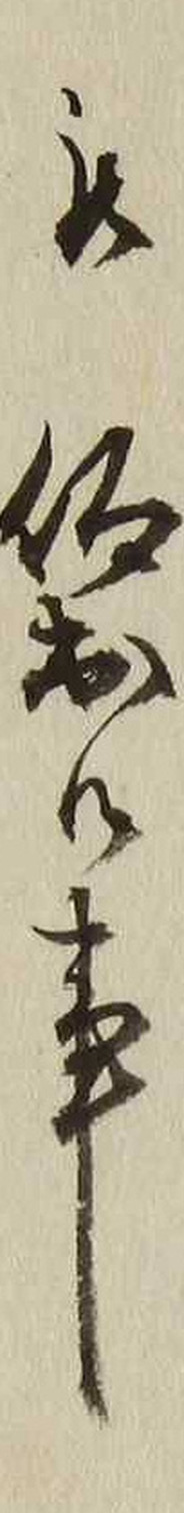被仰出候事
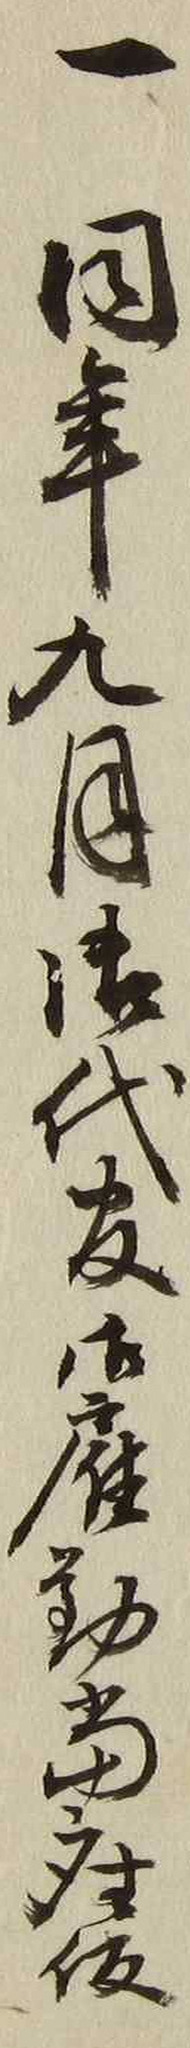一同年九月御代官御雇勤当座仮
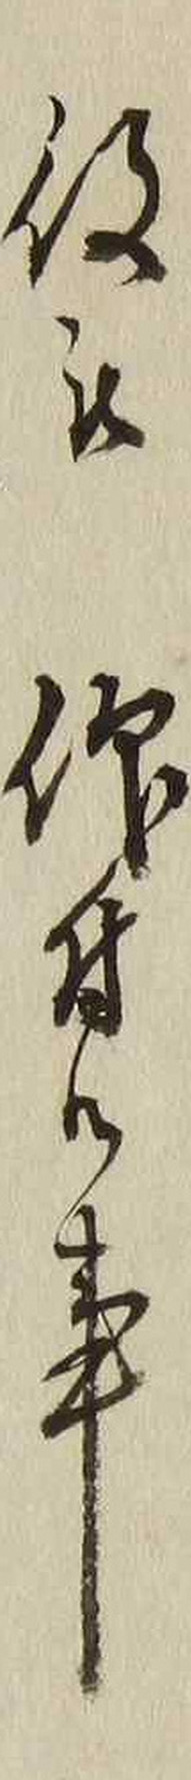役被仰付候事
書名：諸士系譜　巻之23　い之部23
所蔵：会津若松市立会津図書館
